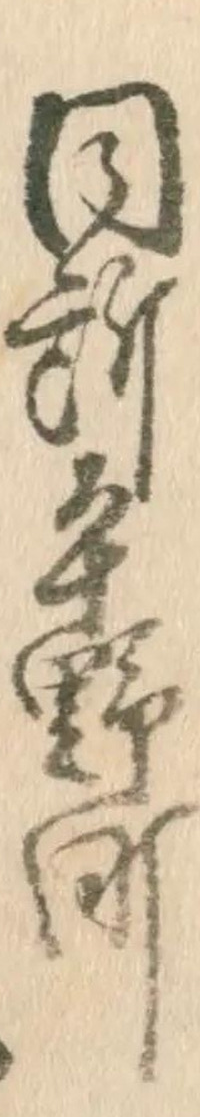同所平野町

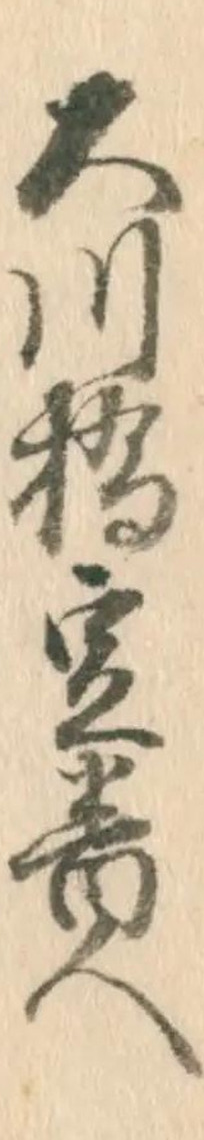大川橋定番人
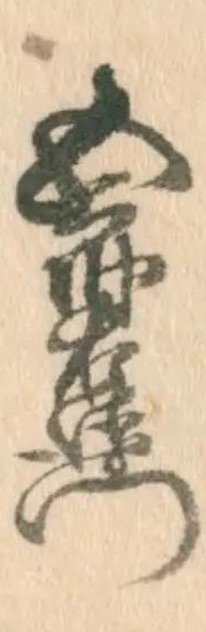五郎右衛門
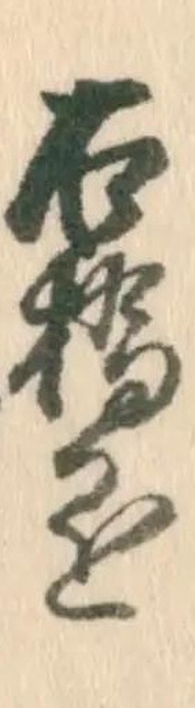右橋懸
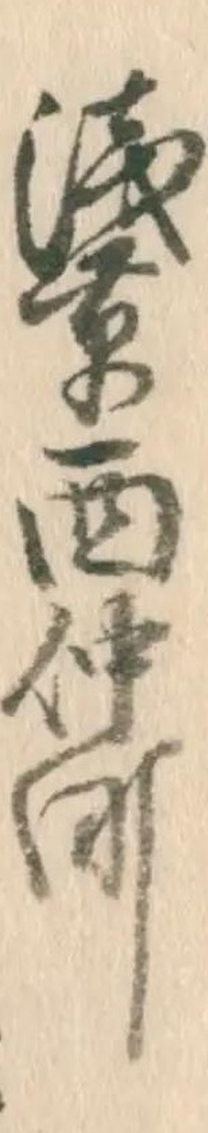浅草西仲町
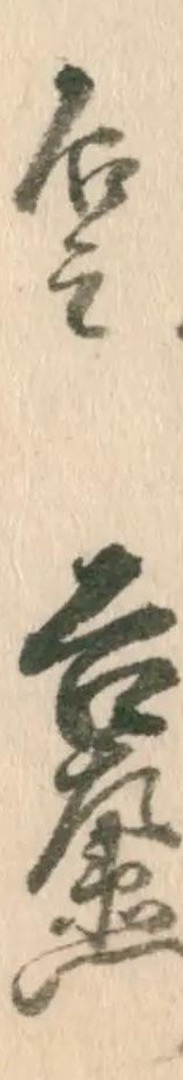名主吉左衛門
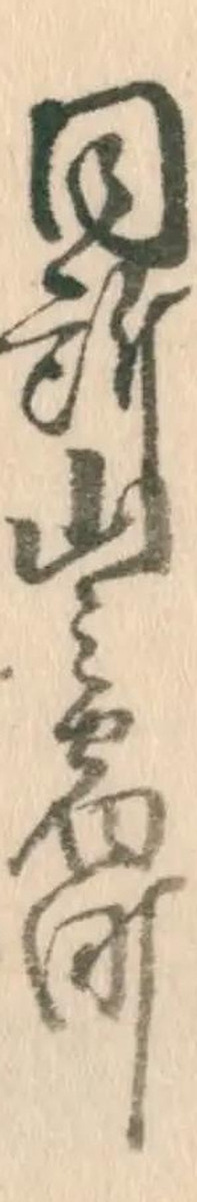同所山之宿町
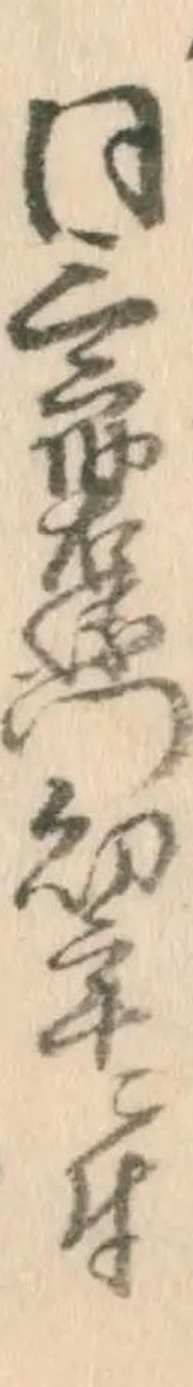同三郎右衛門幼年ニ付
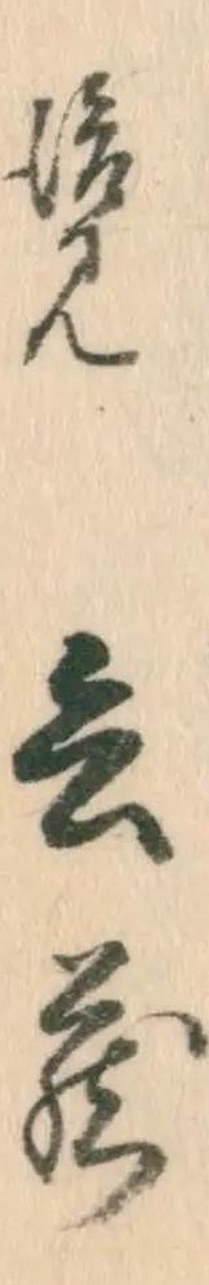後見兵蔵
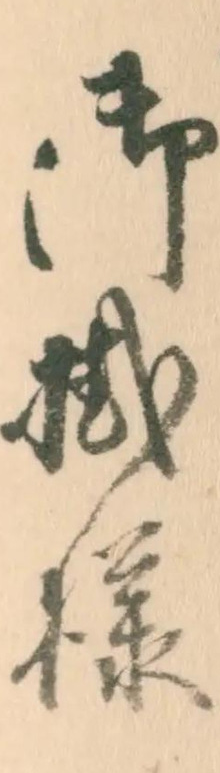御掛様
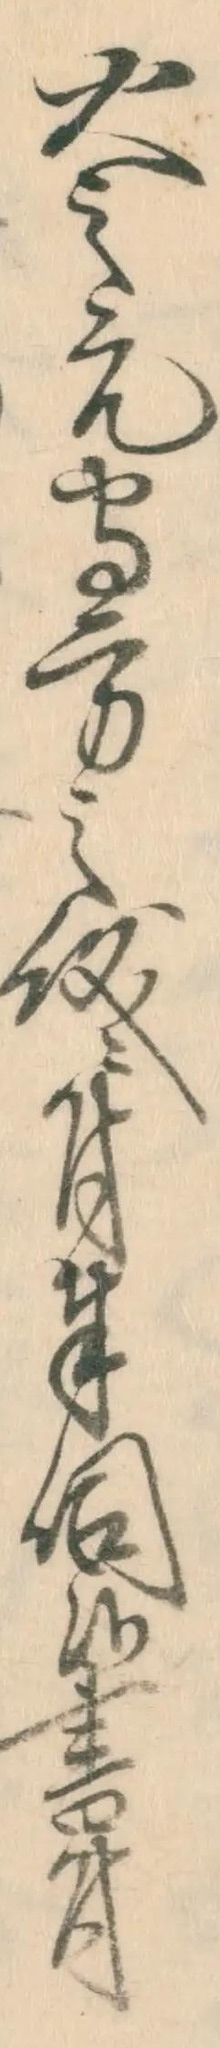火之元守方之儀ニ付奉伺候書付
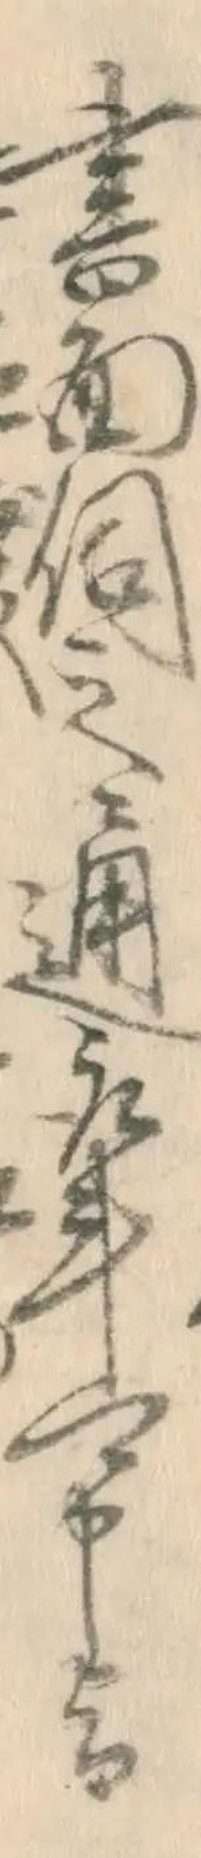書面伺之通取計可申旨
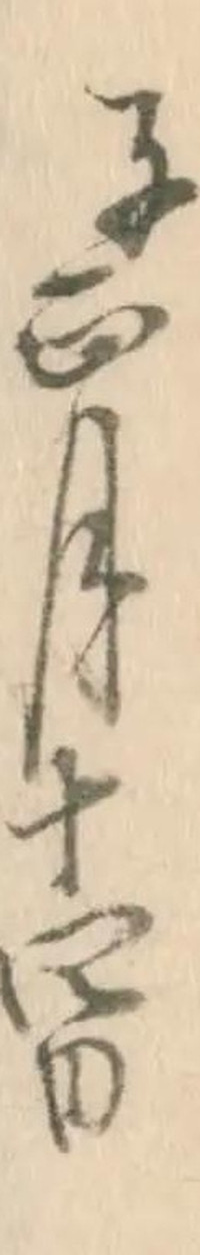子正月十二日
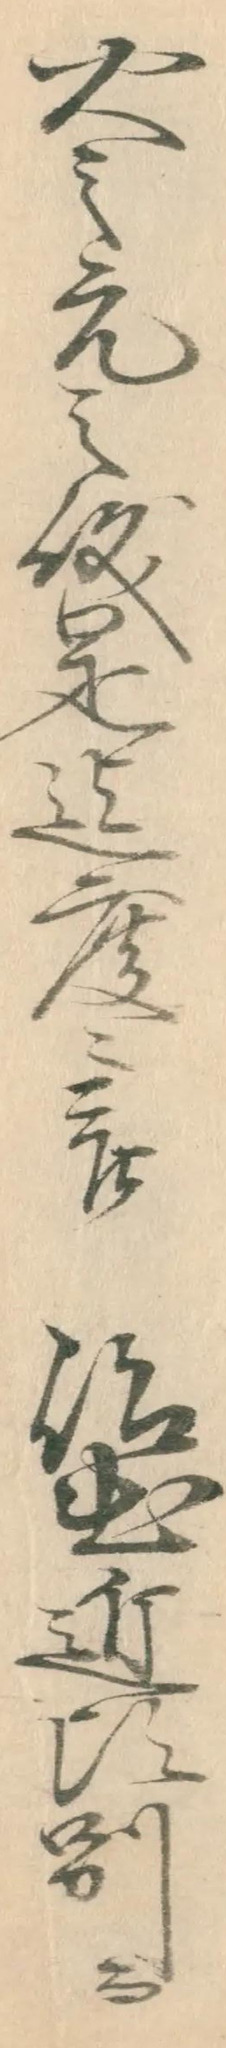火之元之儀是迄度々被仰出近頃別而

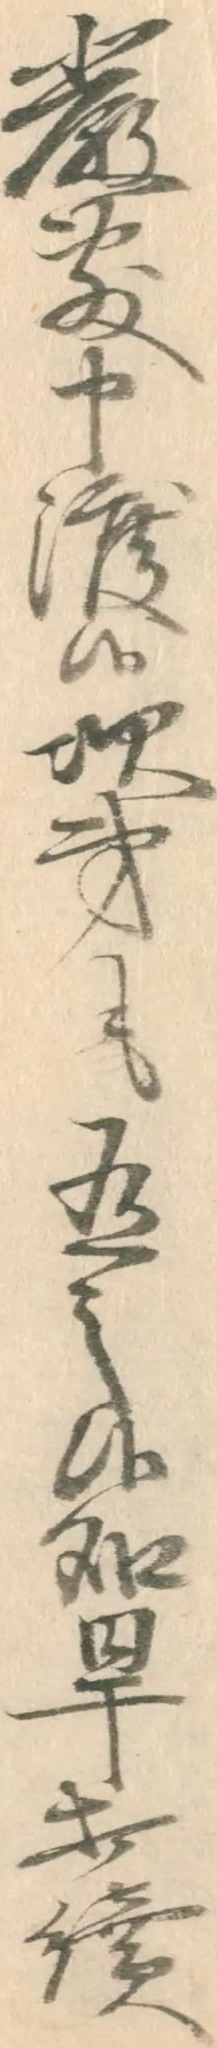厳敷申渡候次第も有之候処旱打続
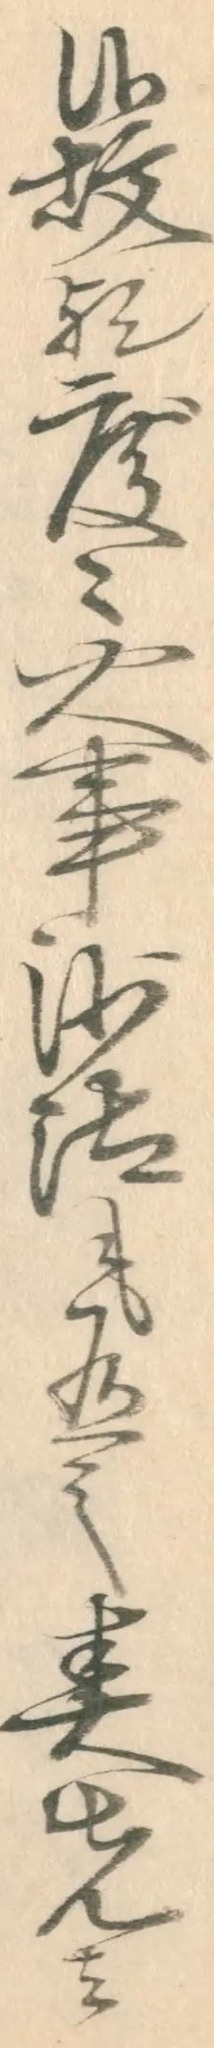候故歟度々火事沙汰も有之春先は
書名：三橋 17巻. [7] 三橋小破御修復書留　但御奉行御掛リ替地震潰橋番屋　嘉永四亥年より安政二卯年迄　上
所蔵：国立国会図書館 National Diet Library, JAPAN
